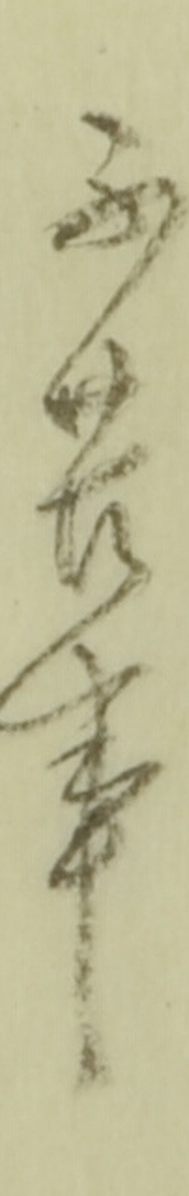不苦事
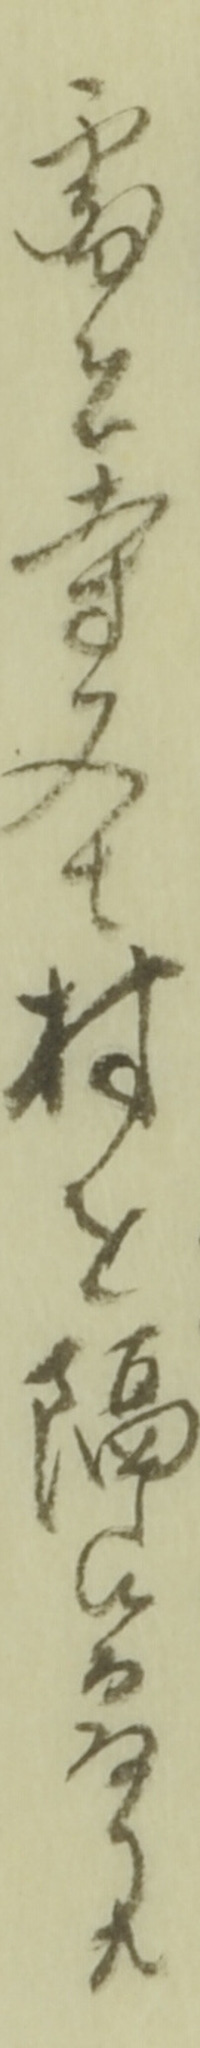處者寺又者村を隔候而なり共
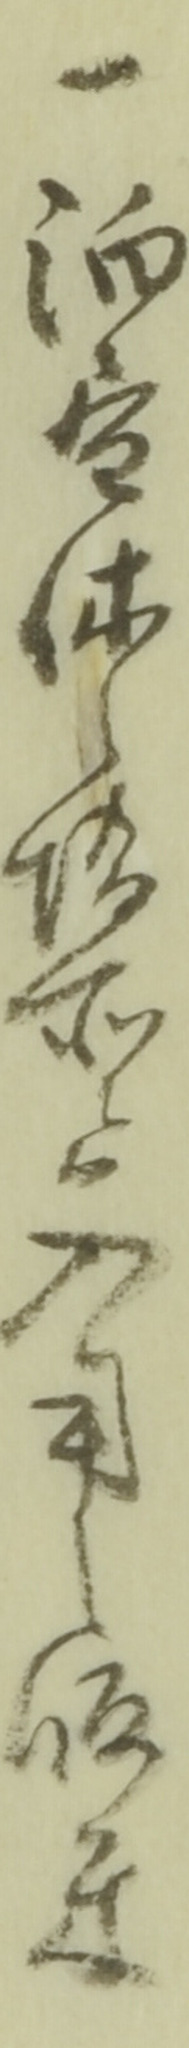一泊宿休候場所二而入用之飯米
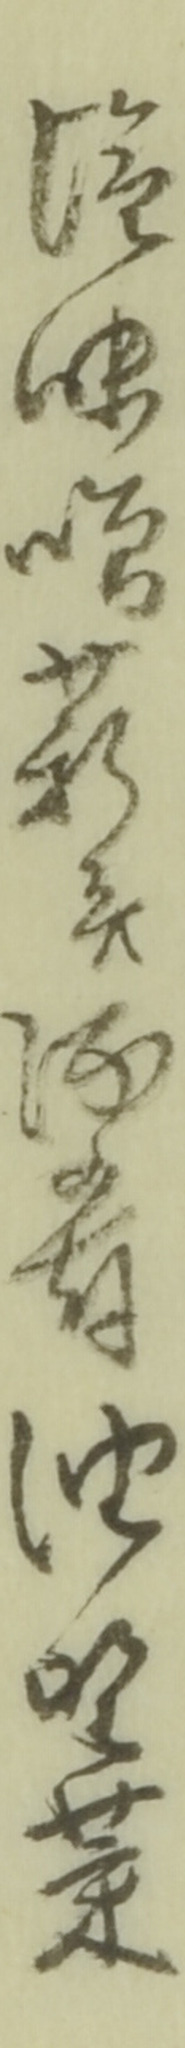塩味噌薪並酒肴油嗜葉
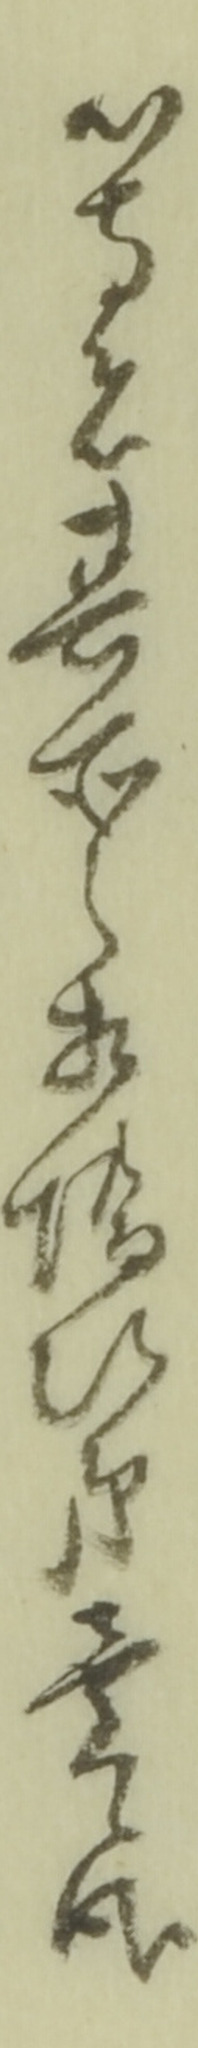等者其所之相場次第売候様
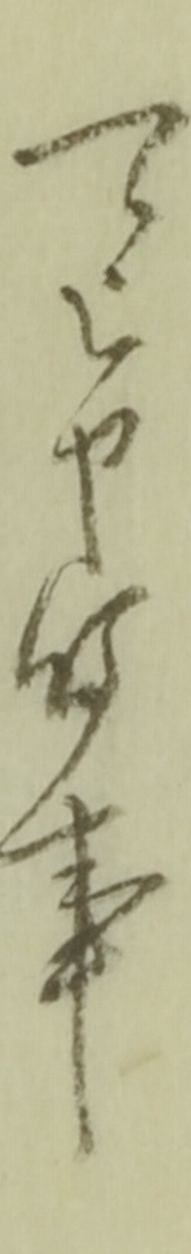可被申付事
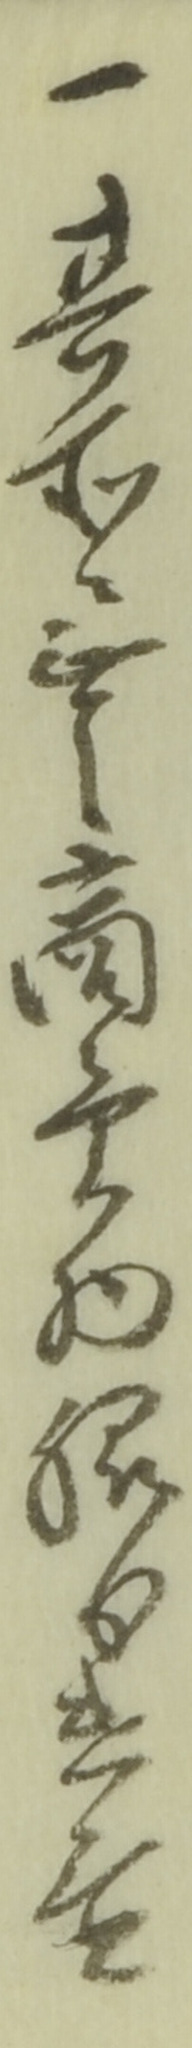一其所二無之商売物銀より遣置

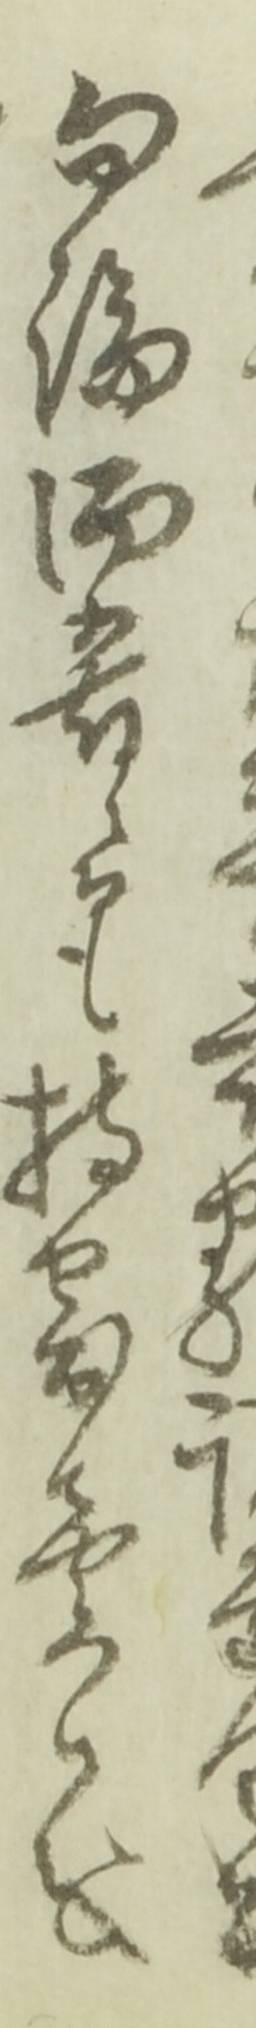勿論酒肴候而も持セ出売候義
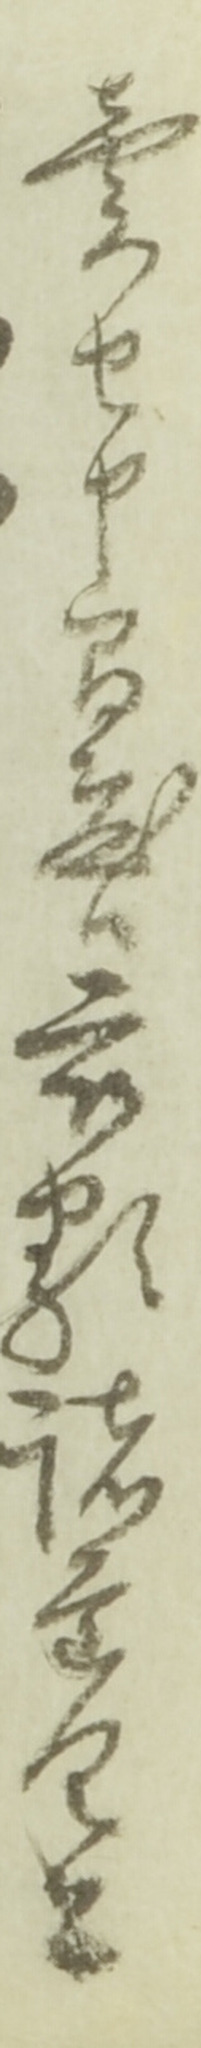売セ申間敷候衣類諸道具ハ
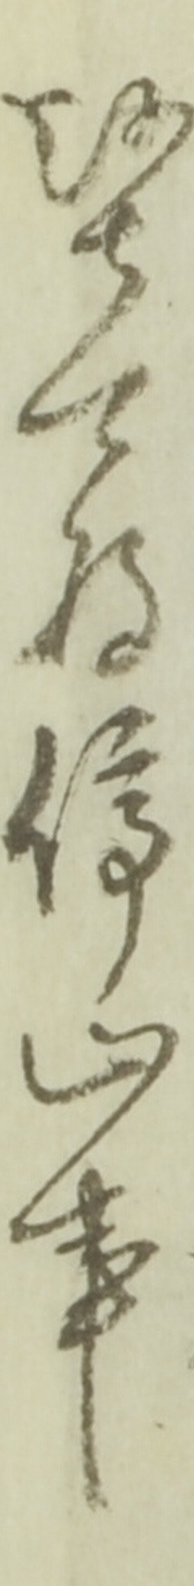何も可為停止事
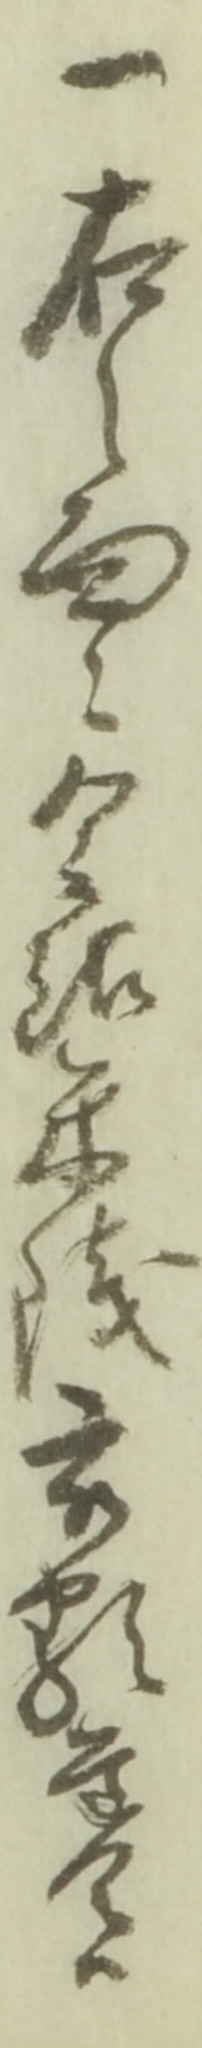一右之面々金銀米銭衣類重々ハ
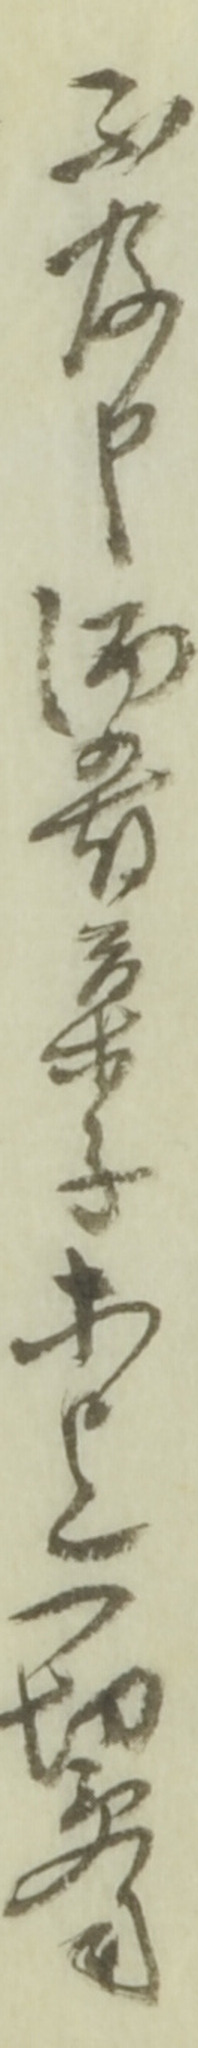不及申酒肴菓子等迄一切受用
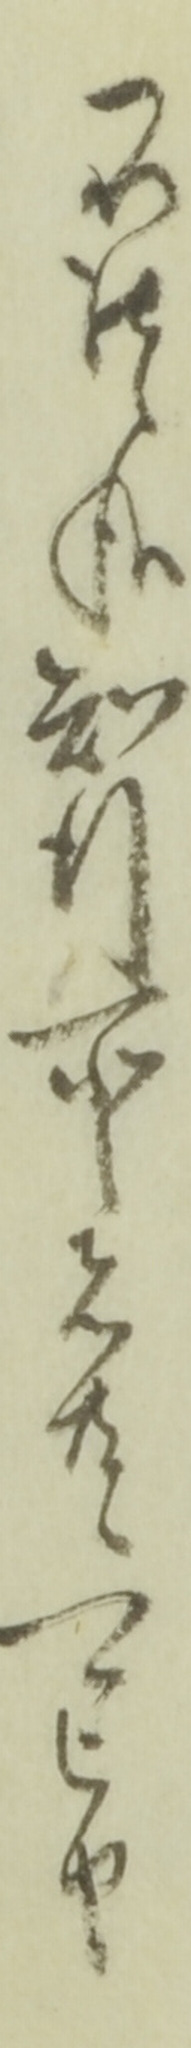所仕候様知行所の者共へ可被申
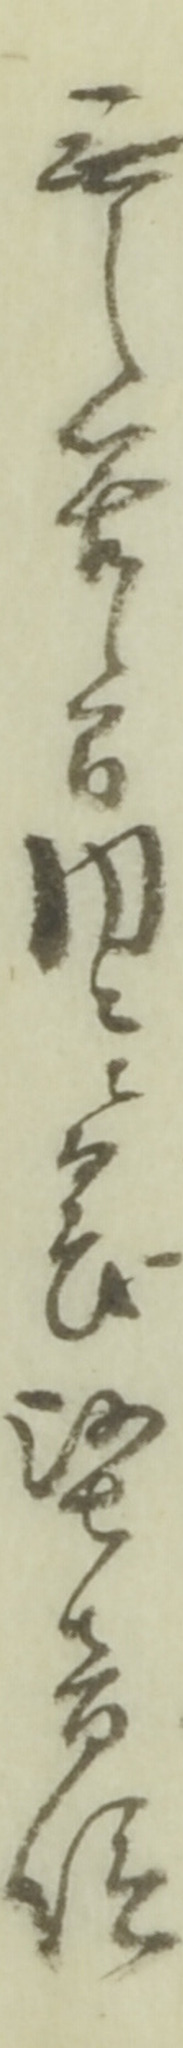無之筈候間内々二而茂堅音信
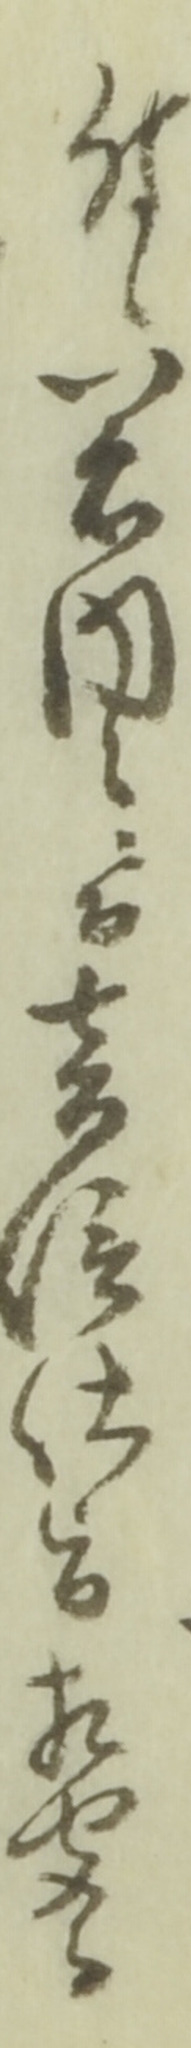付候若内々二而音信仕旨相聞候
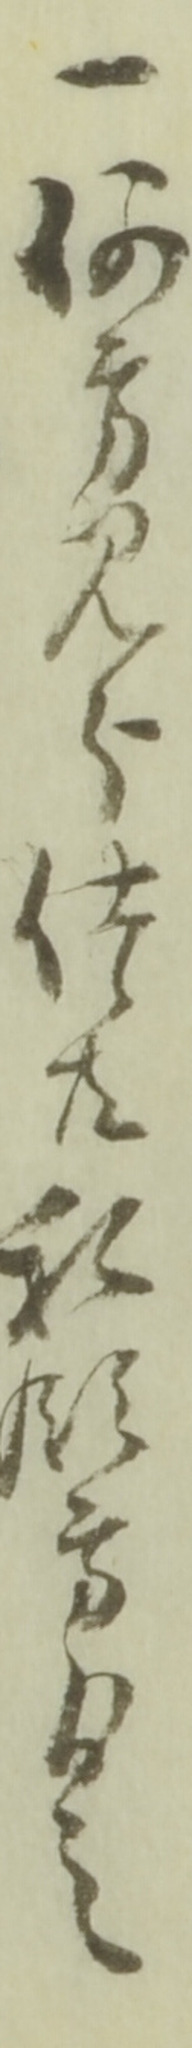一何方見分と仕候共私領方より之
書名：御公儀様御領主様御触書控
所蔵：伊那市立高遠町図書館・合同会社AMANE
